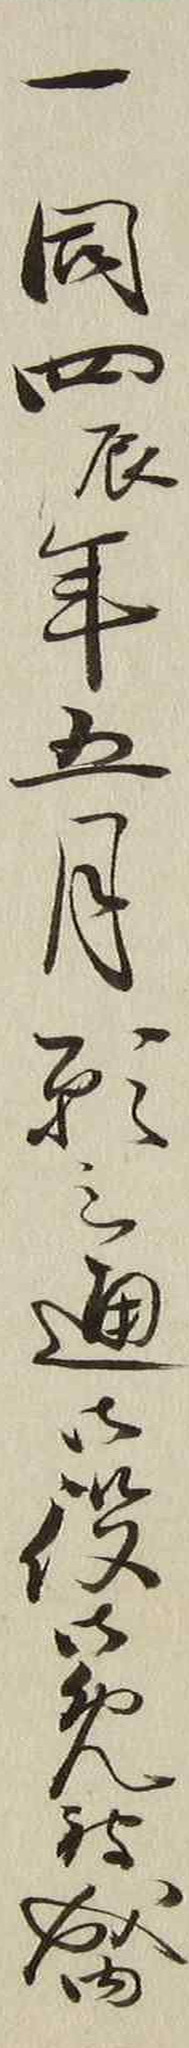一同四辰年五月願之通御役御免被成内
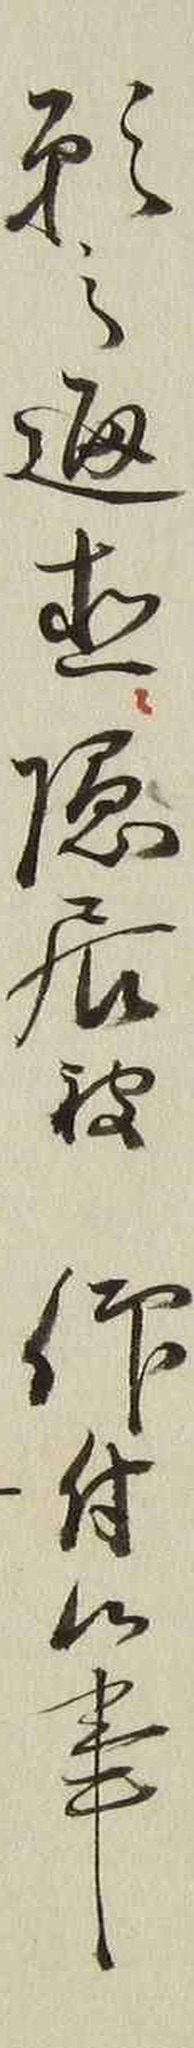願之通直隠居被仰付候事
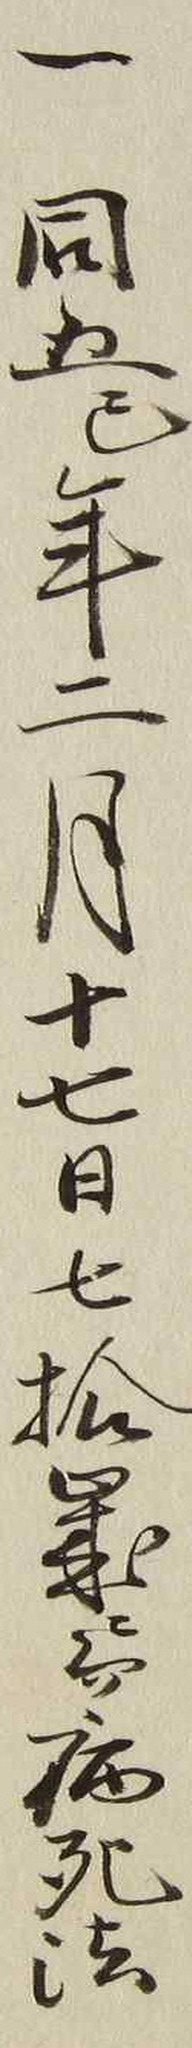一同五巳年二月十七日七拾歳ニ而病死法
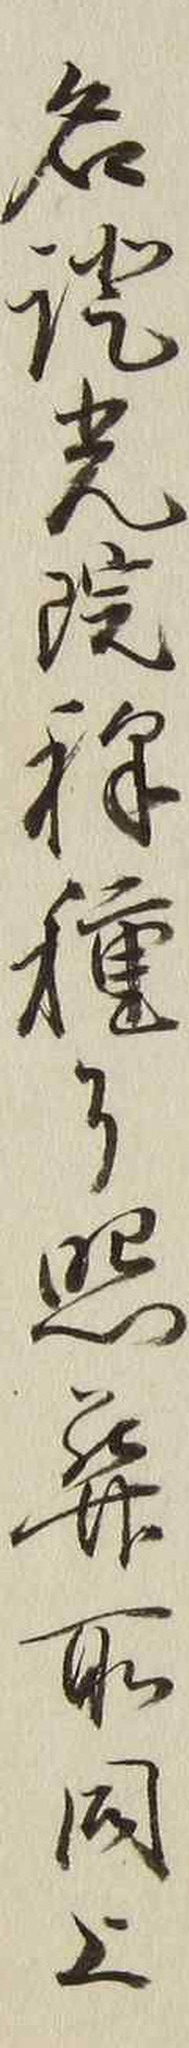名證光院釈種了照葬所同上

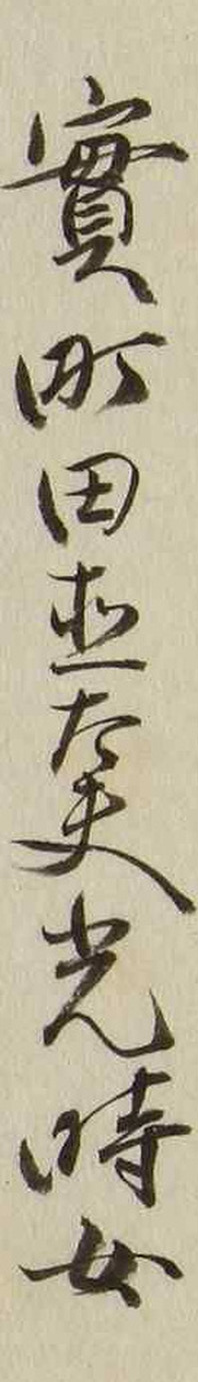実町田直太夫光時女
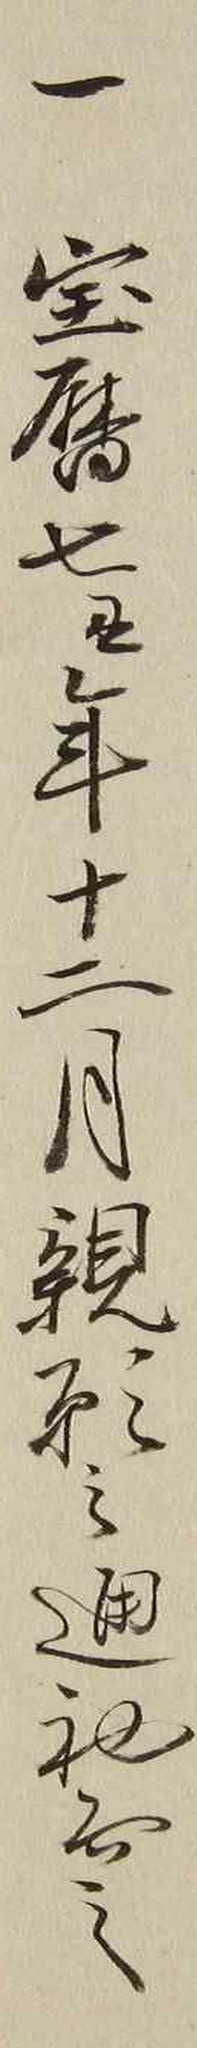一宝暦七丑年十二月親願之通初而之
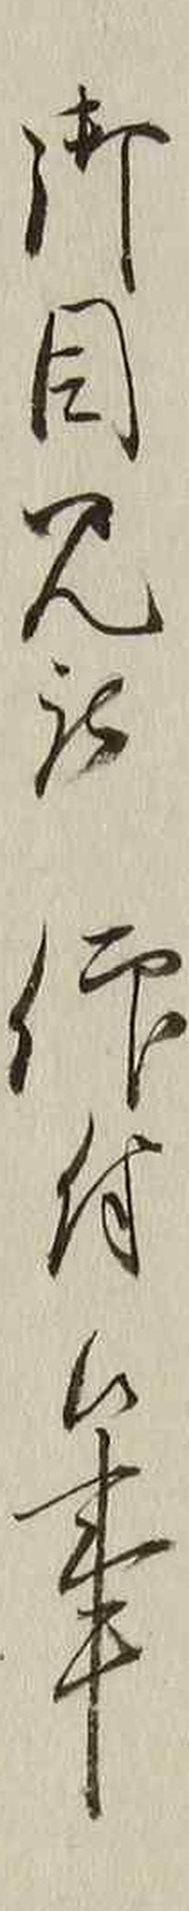御目見被仰付候事
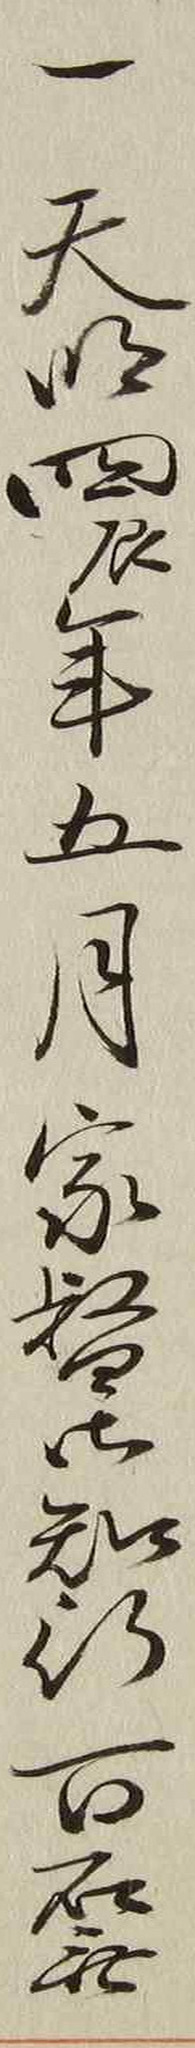一天明四辰年五月家督御知行百石無
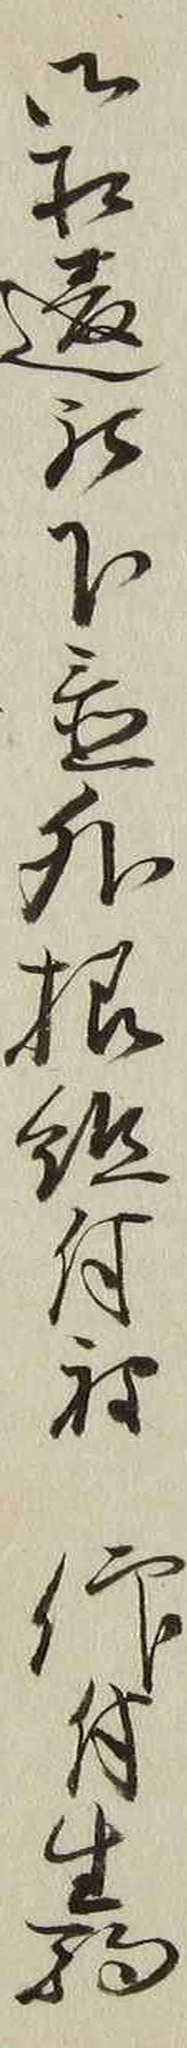御相違被下置外様組付被仰付生駒
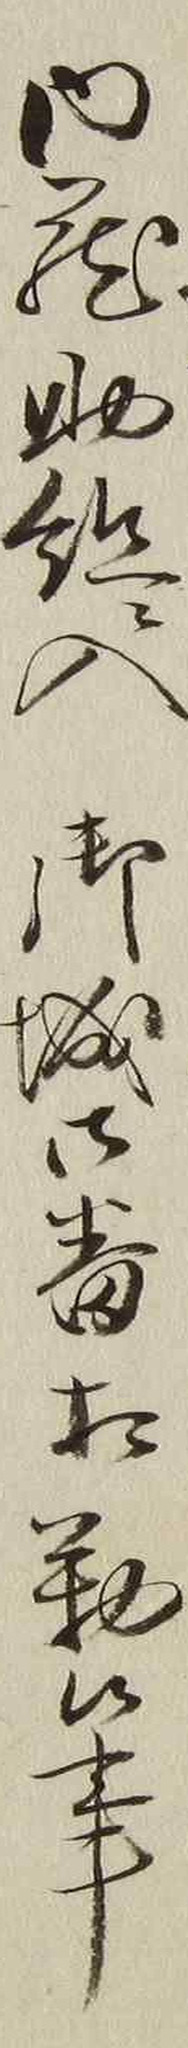内蔵助組ニ入御城御番相勤候事
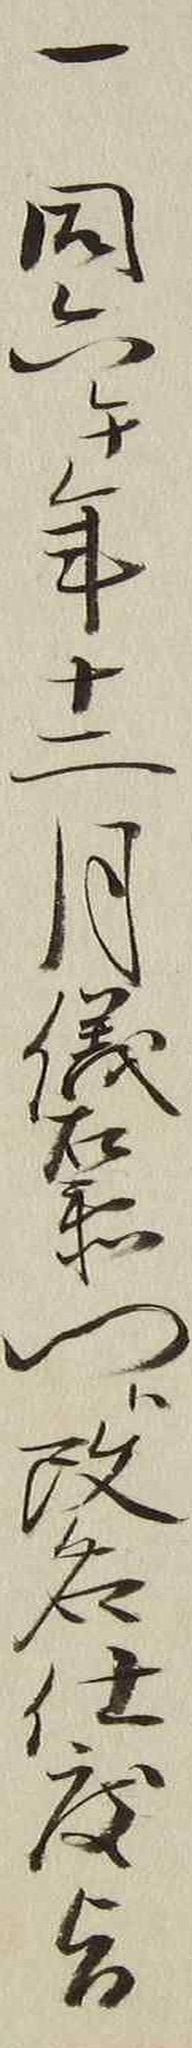一同六午年十二月儀右衛門は改名仕度旨
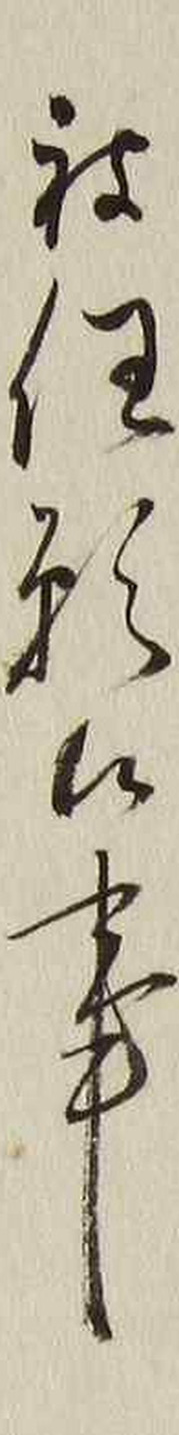被任願候事
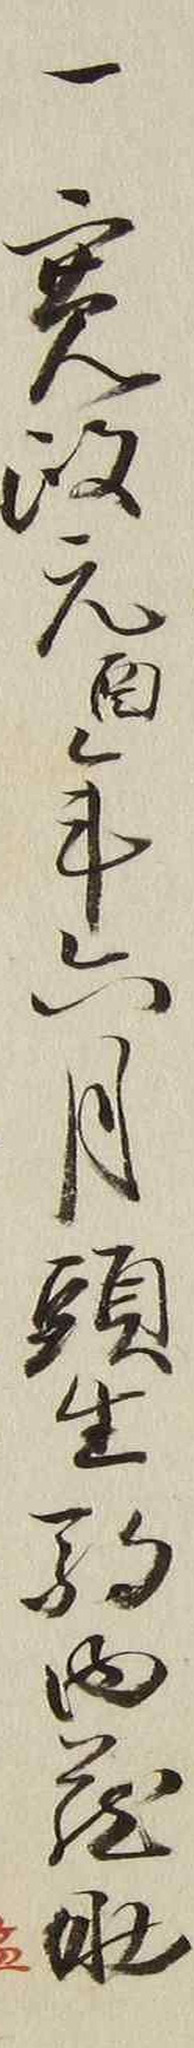一寛政元酉年六月頭生駒内蔵
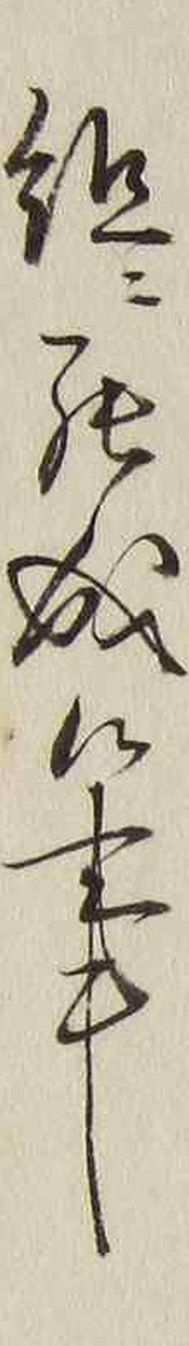組ニ罷成候事
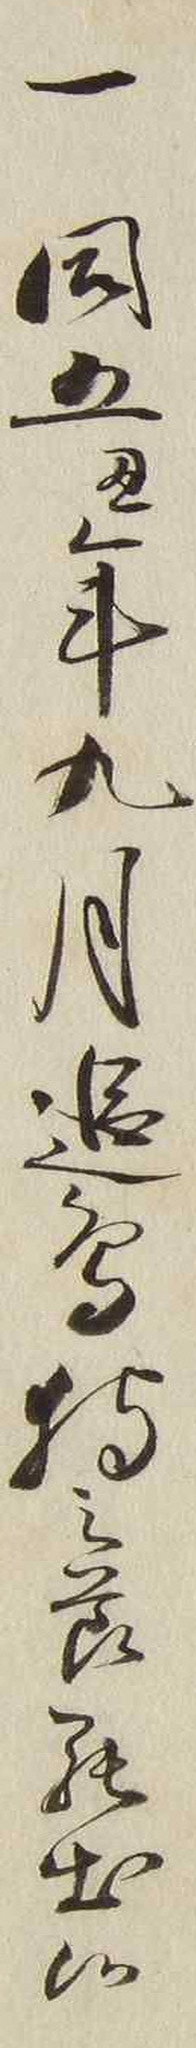一同五丑年九月追鳥狩之節罷出候

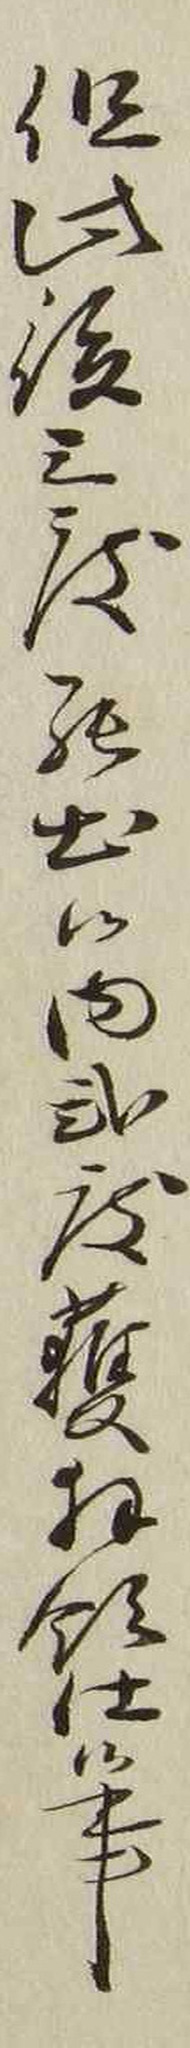但此後三度罷出候内弐度獲拝領仕候事
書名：諸士系譜　巻之163　な之部5
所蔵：会津若松市立会津図書館
